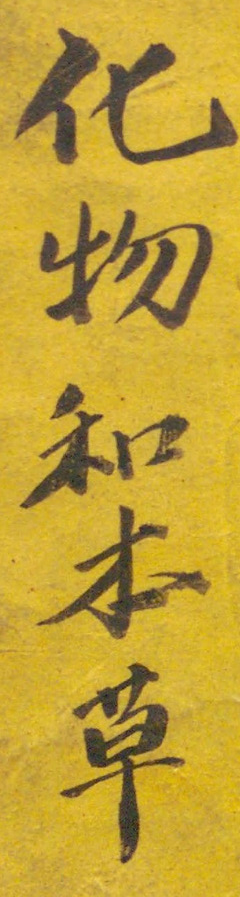化物和本草

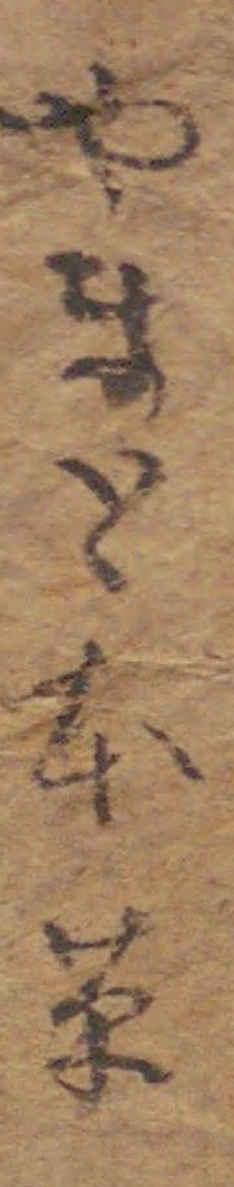やまと本草

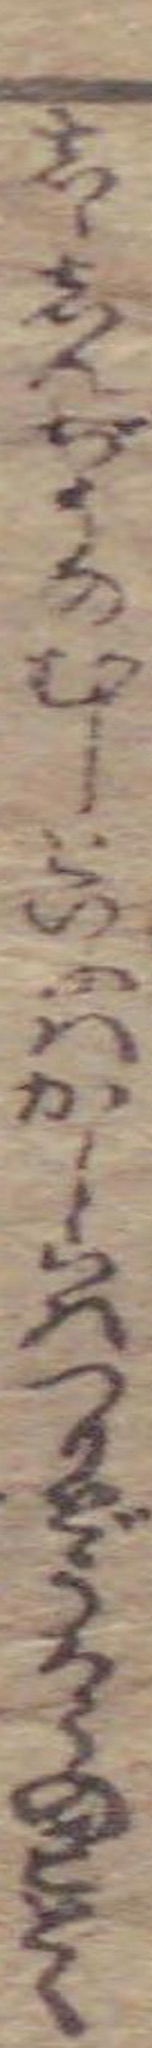しゝしんぢうのむしといふはかしらはつりどうろうのことく
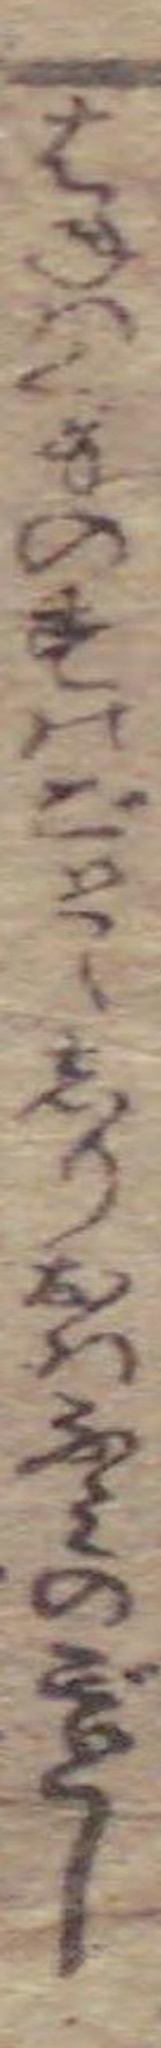はねはくものすのごとくしりおはふみのごとし
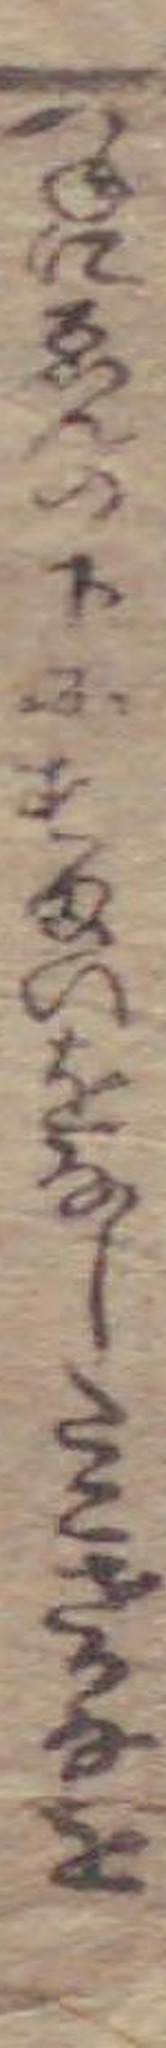つねにゑんの下にすまいをなしたこざかなを
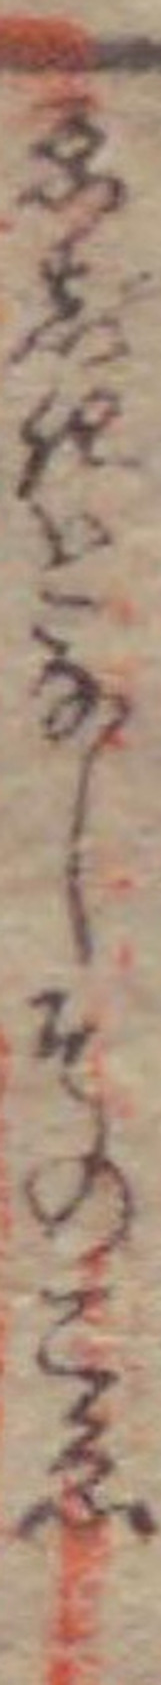ゑじきとなしそのこゑ
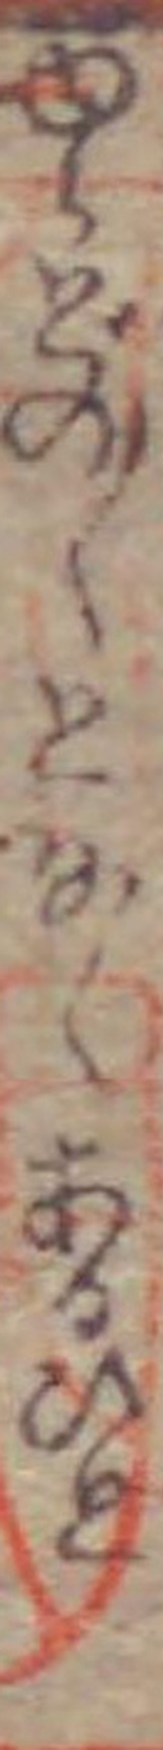ゆらどの〳〵となくあるひと
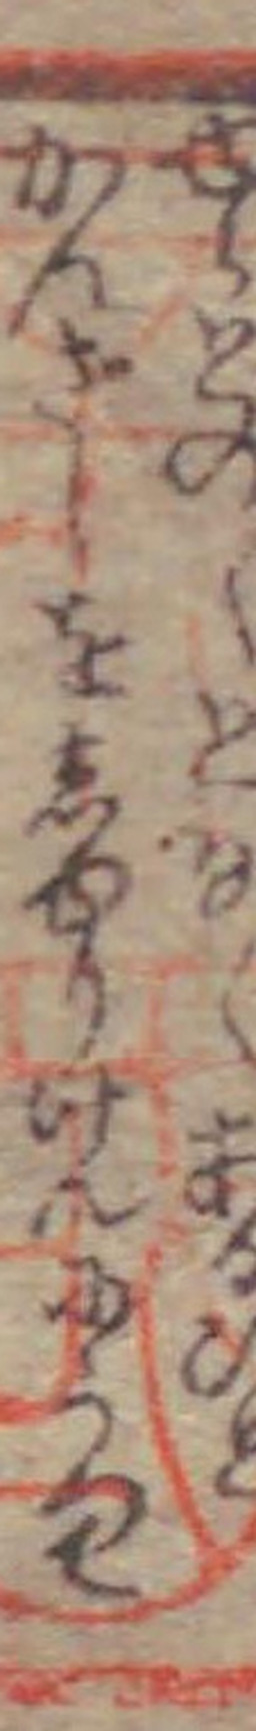かんざしをしゆりけんにうつて
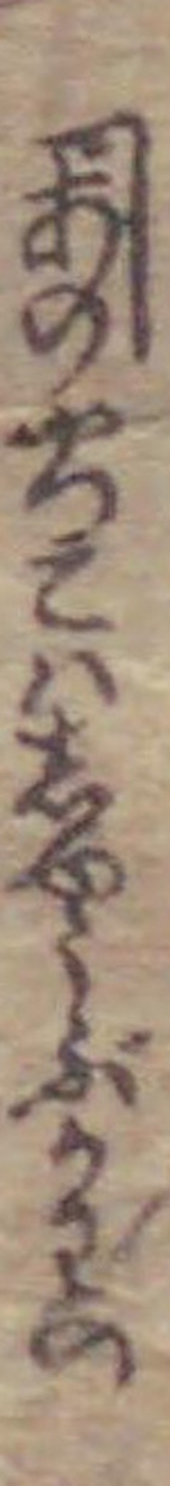〽あのやつこはしやうぶかはの
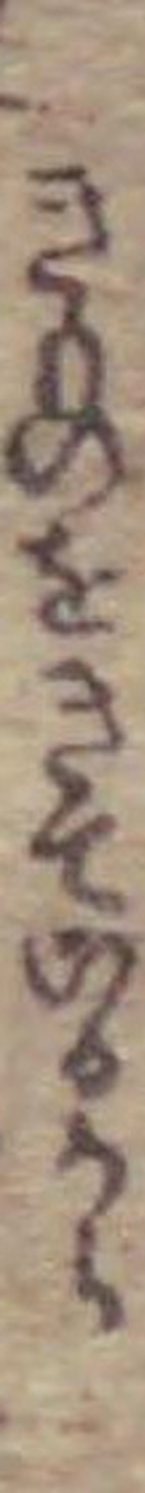きものをきているから
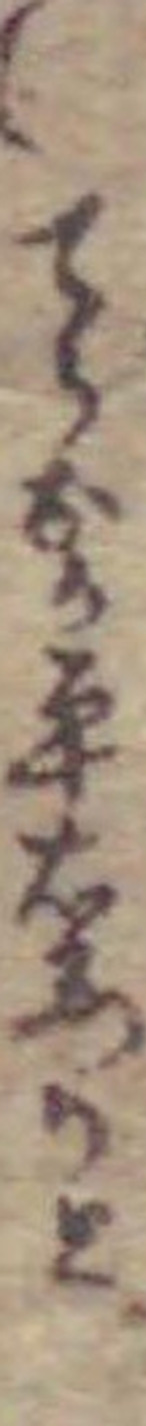てらおか平右ゑ門かと
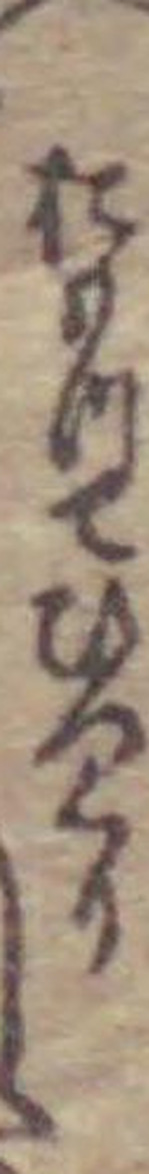おもつてひつくりした
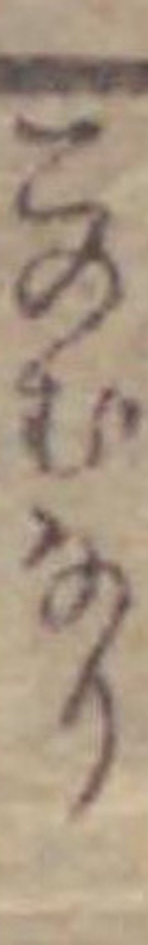このむなり
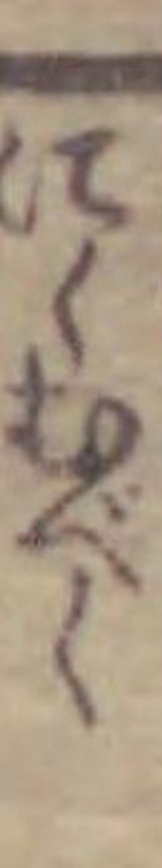にくむべく
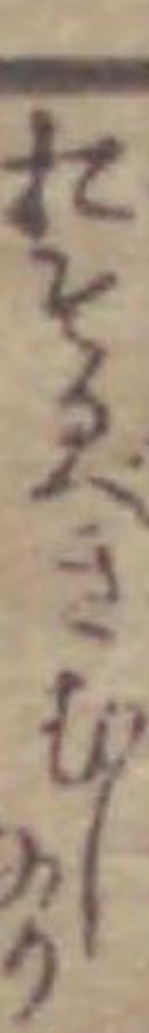おそるべきむしなり
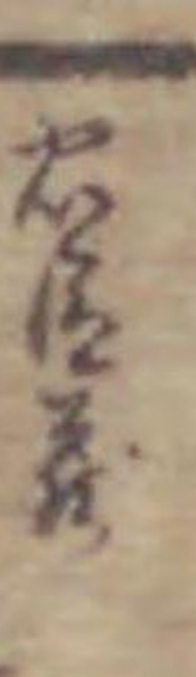忠臣蔵
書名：化物和本草 : 3巻
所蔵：国立国会図書館 National Diet Library, JAPAN
